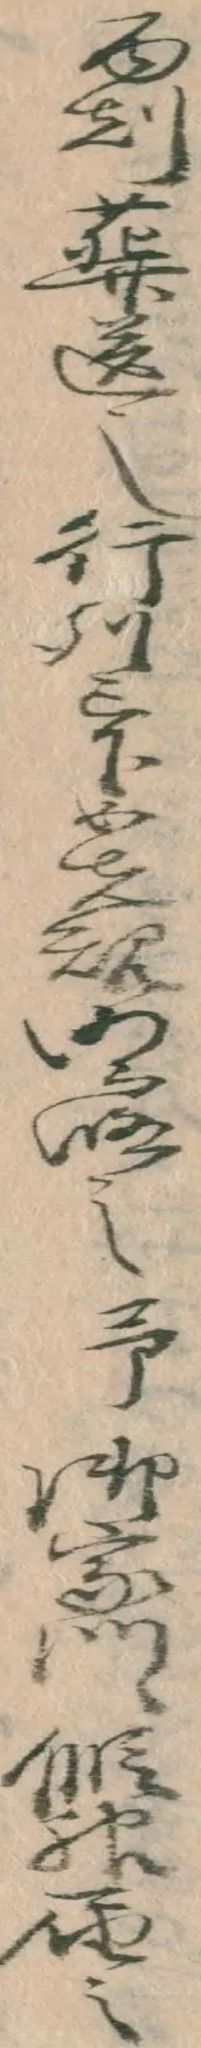酉刻葬送也行列已下御先規仍而略也予御家門へ假服届之
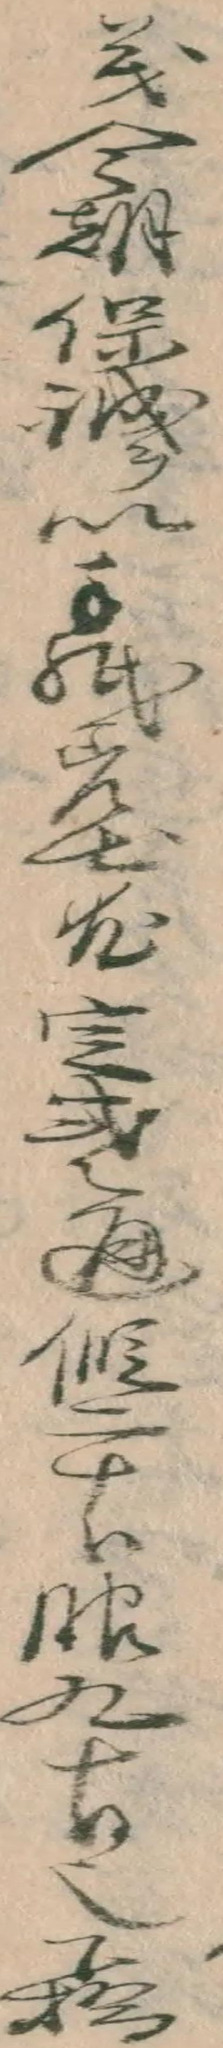義今朝保誠ヲ以手紙差出尤定式之通假二十日服九十日也下橋
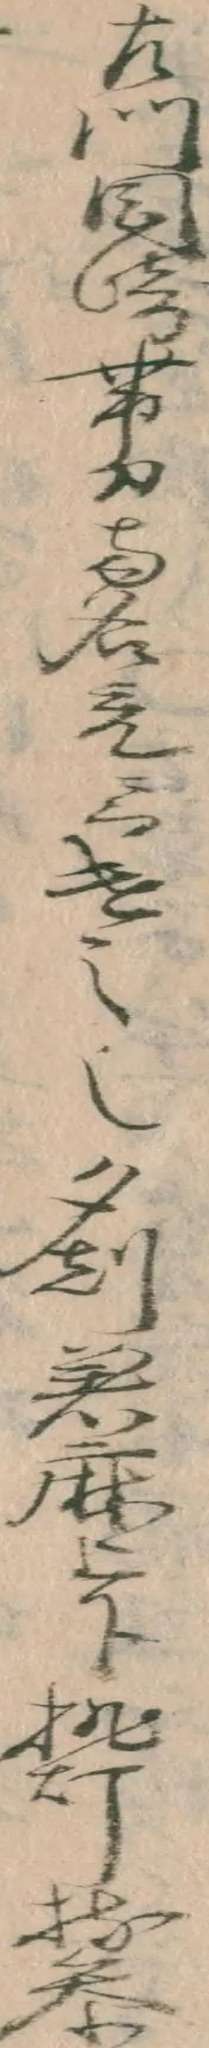左門岡崎帯刀両名宛ニ而遣之也夕刻着麻上下へ挑灯持参
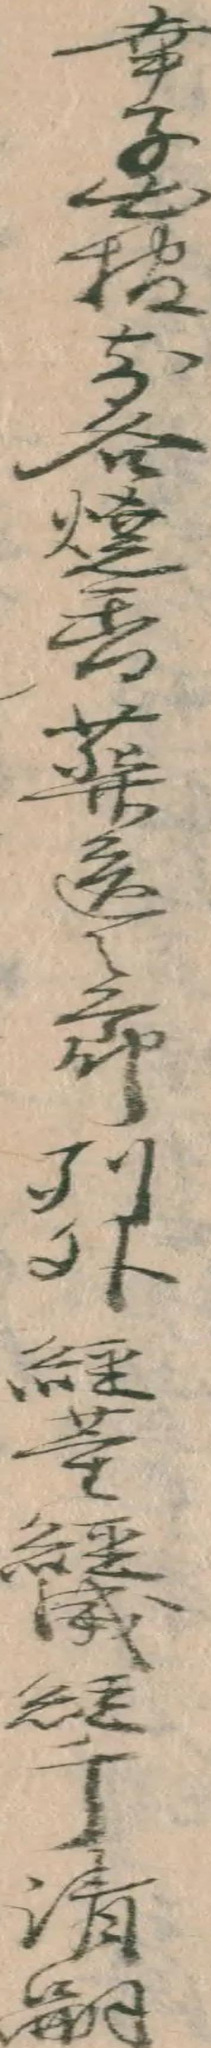幸子出棺前各焼香葬送之節列外経董経威経千清嗣
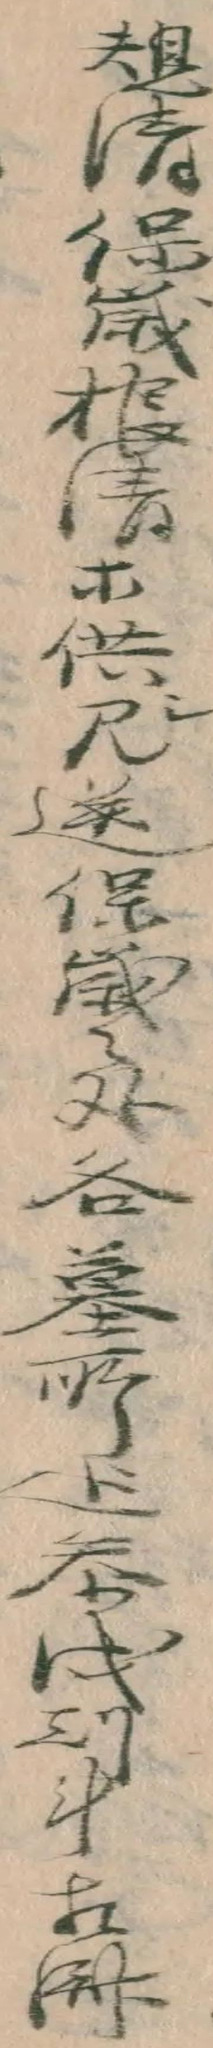規清保歳根清等供シ見送保歳之外各墓所迄参戌刻斗相済
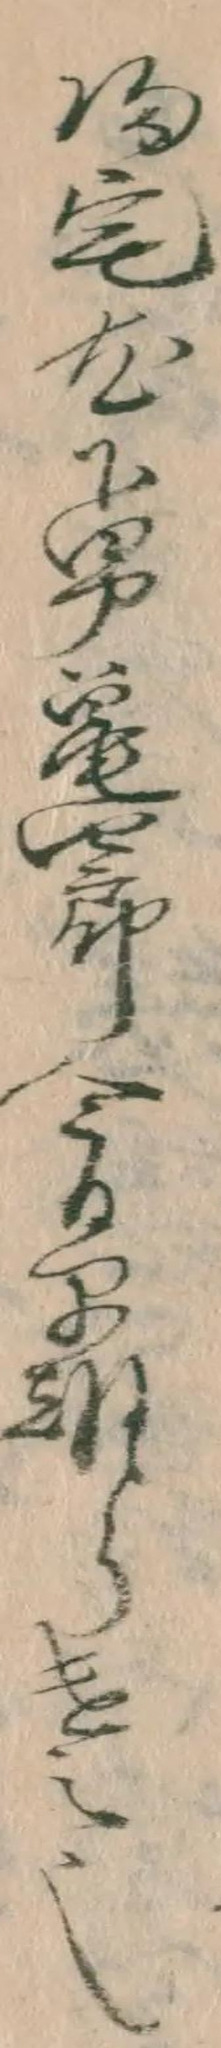帰宅尤下男亀四郎今日早朝より遣之也
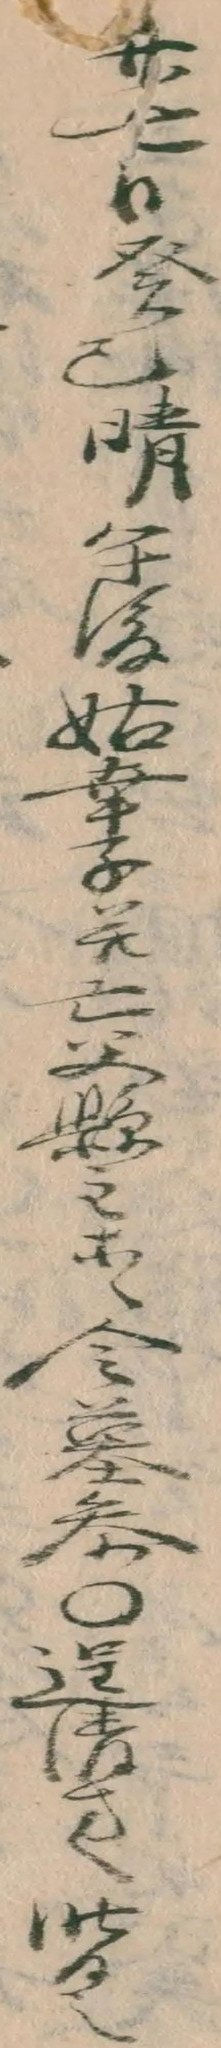廿七日癸巳晴午後姑幸子并亡父縣主等へ令墓参〇逞清方へ昨日之
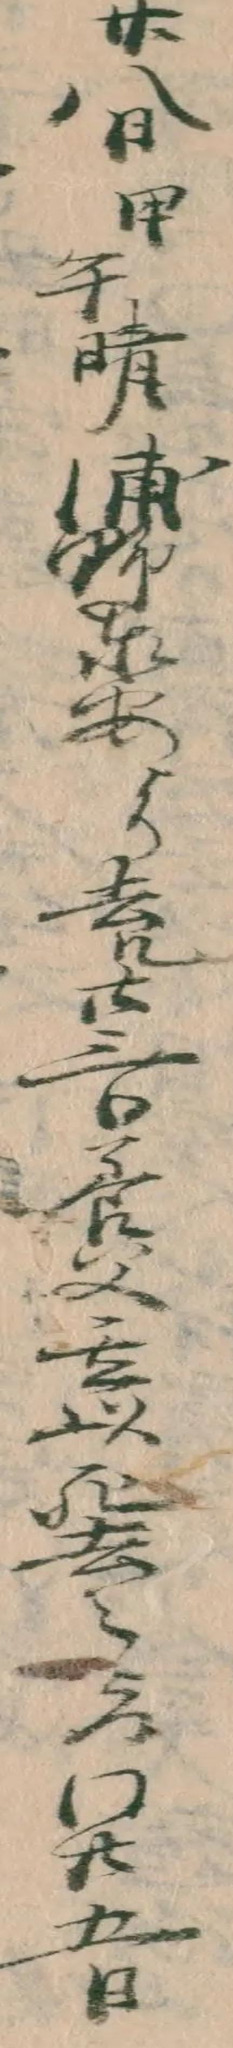廿八日甲午晴浦野東安より去ル廿三日養父玄以死去之旨同廿五日
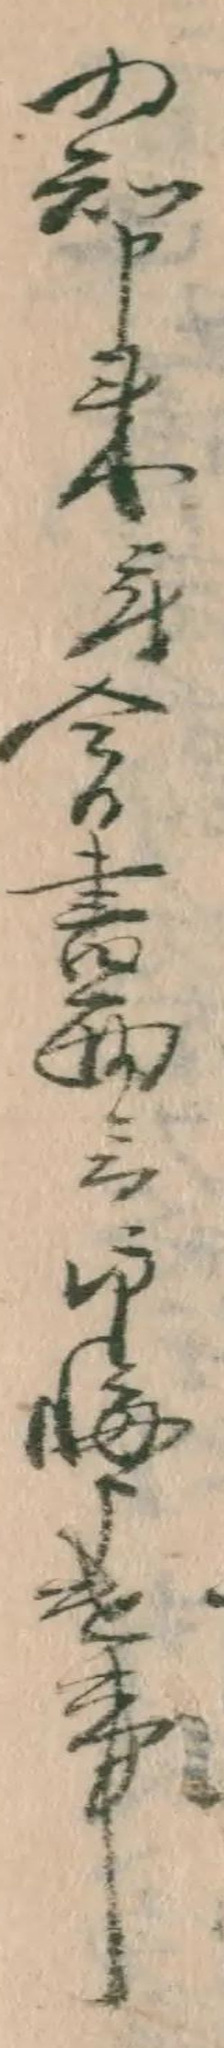可知申来ニ付今日書面ニ而弔悔申遣事
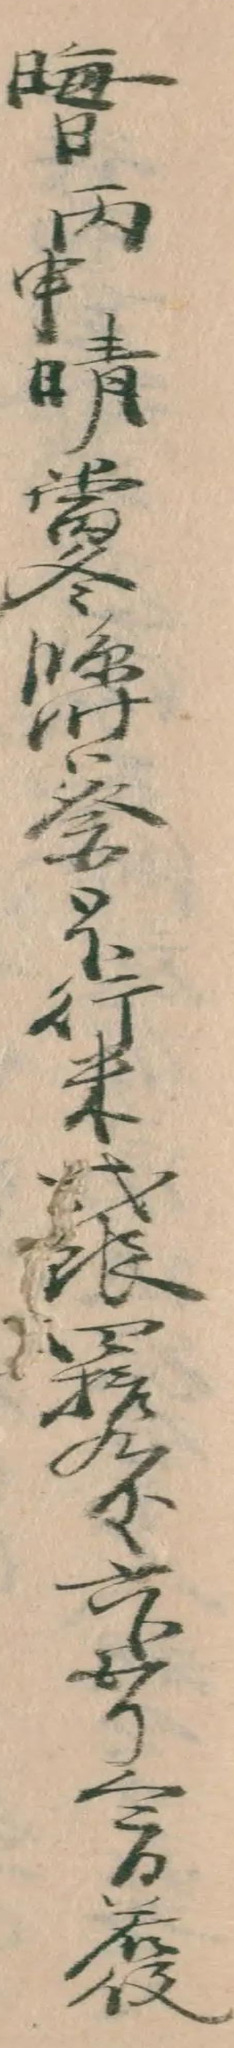晦日丙申晴當冬臨時御祭被下行米代銀四拾九匁六分五り今日若役
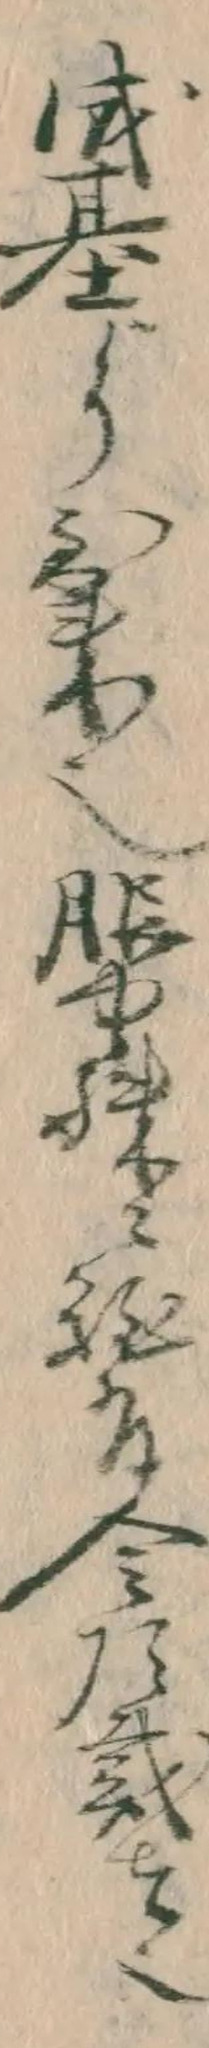成基より到来也服中殊ニ難有令頂戴者也
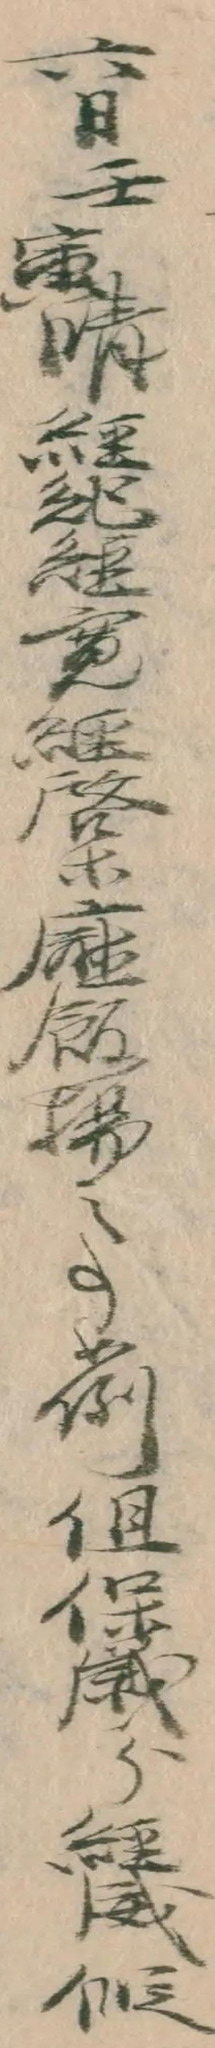六日壬寅晴経紀経寛経啓等廰飯揚之事如例但保歳分経威假
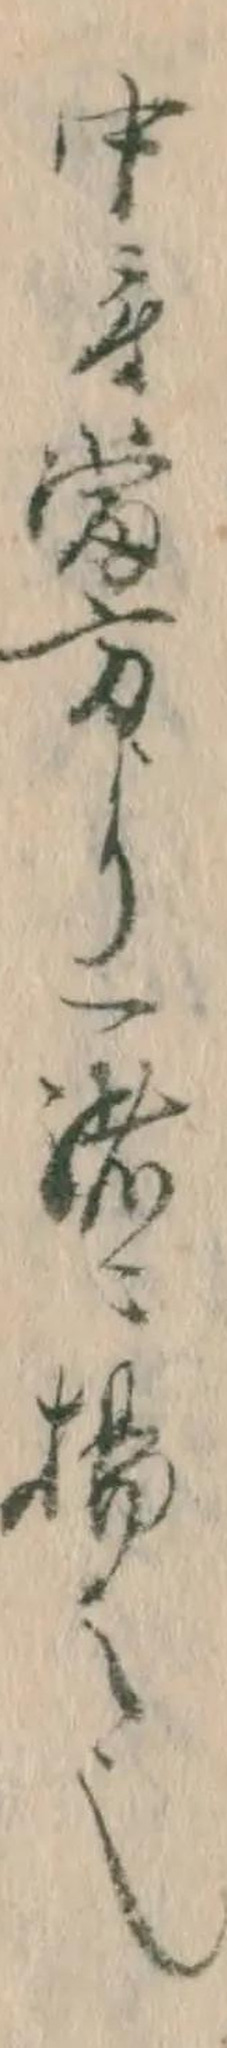中に付當方より一緒に揚之也
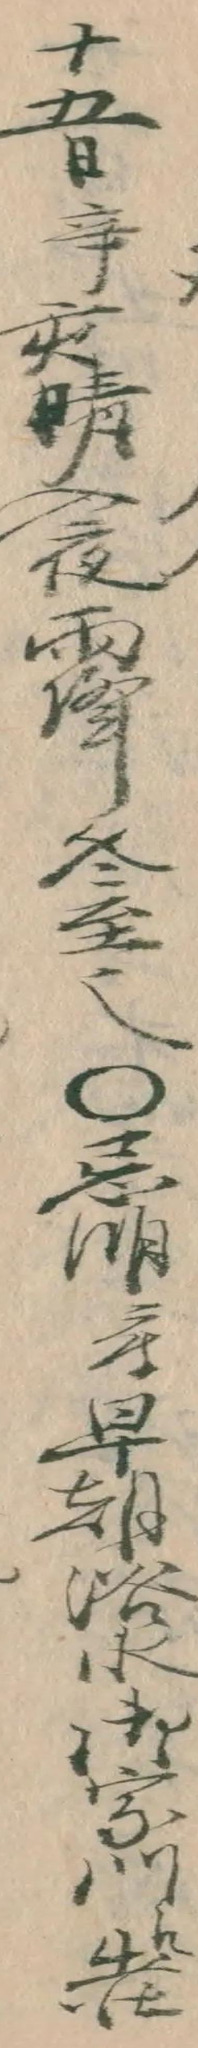十五日辛亥晴入夜雨降冬至也○忌明ニ付早朝浴水御家門江出仕
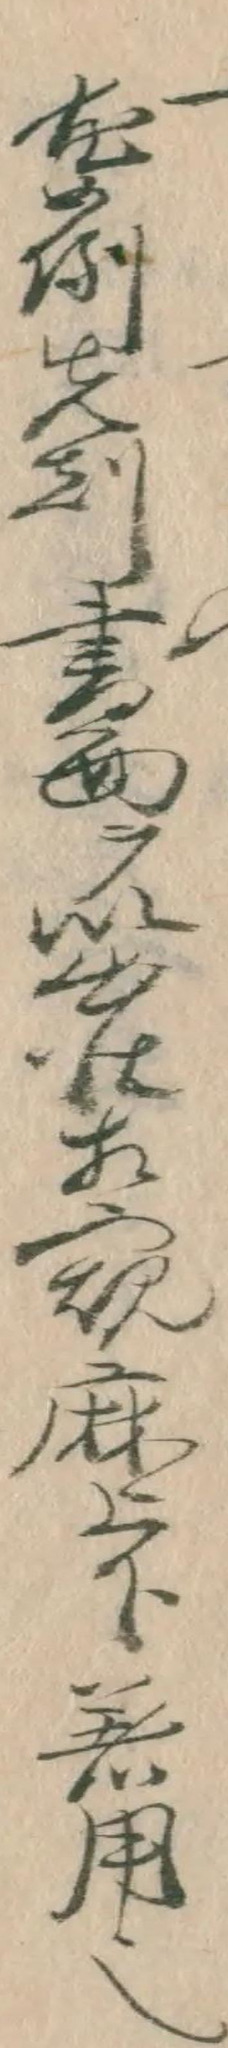尤如例先刻書面ヲ以出仕相窺う麻上下着用也
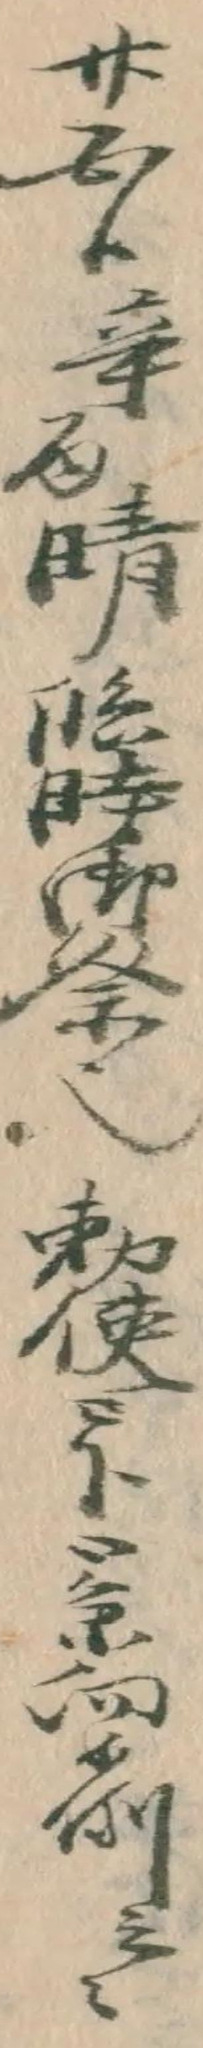廿五日辛酉晴臨時御祭也勅使被下御参向如例云々
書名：賀茂社記録. 第65冊
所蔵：国立国会図書館 National Diet Library, JAPAN
